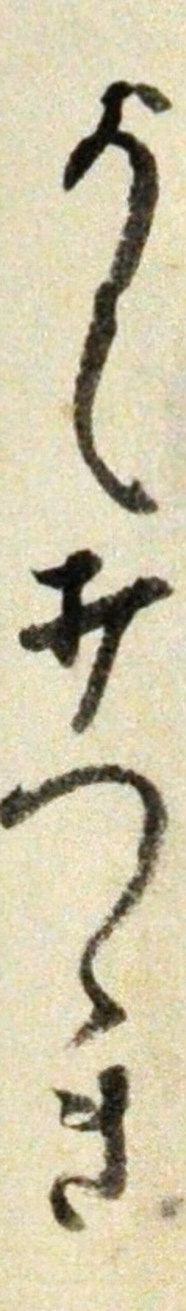尚々打つゝき
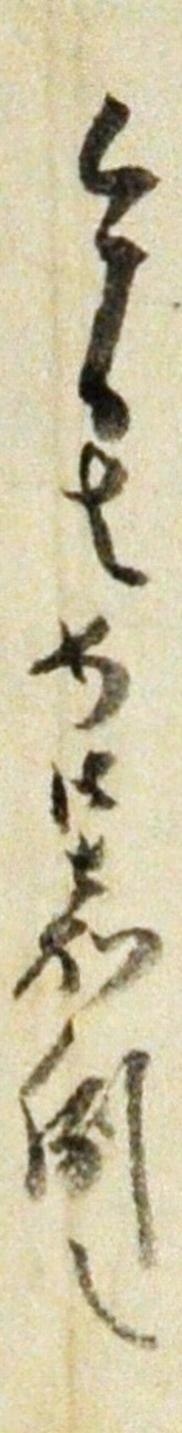今日は如御嘉例之
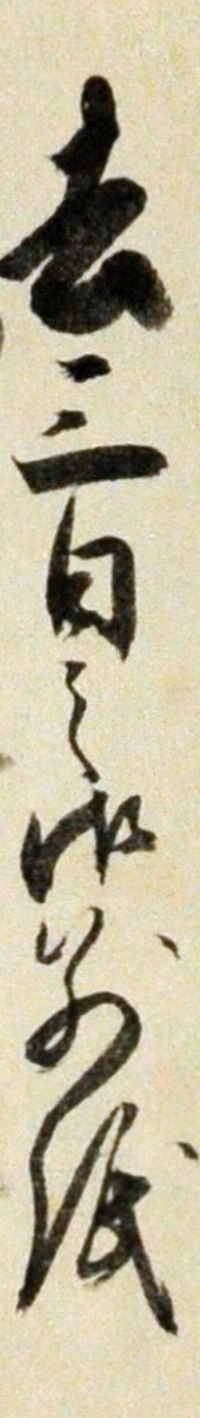去三日之御別紙
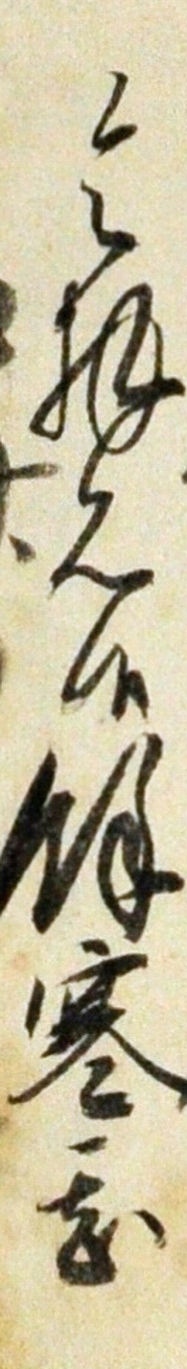令拝見候余寒甚
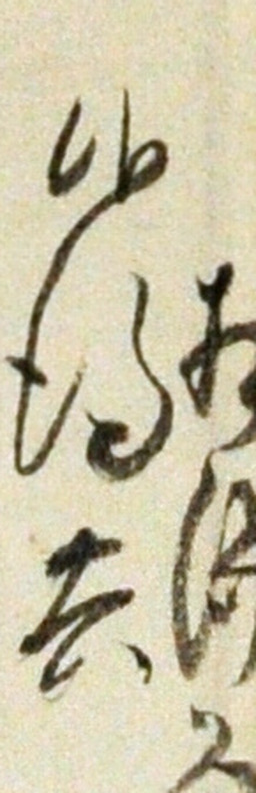候得共
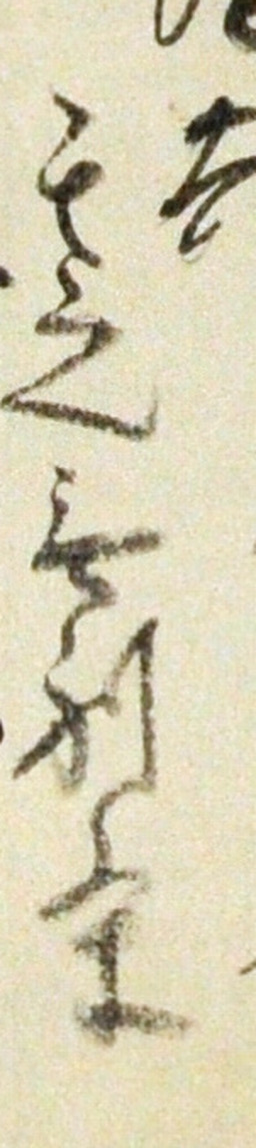其元無別条
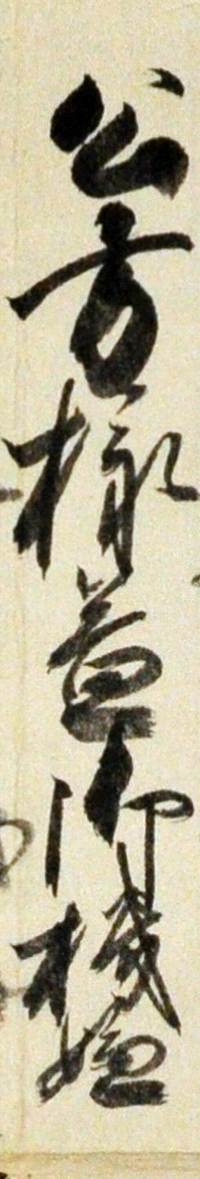公方様益御機嫌
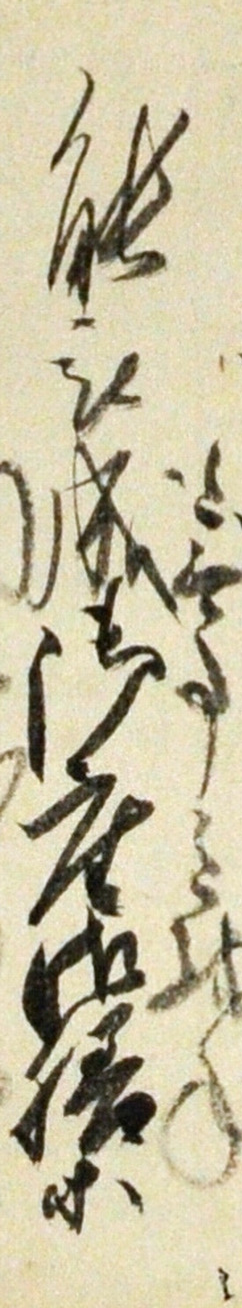能被成御座御膳等
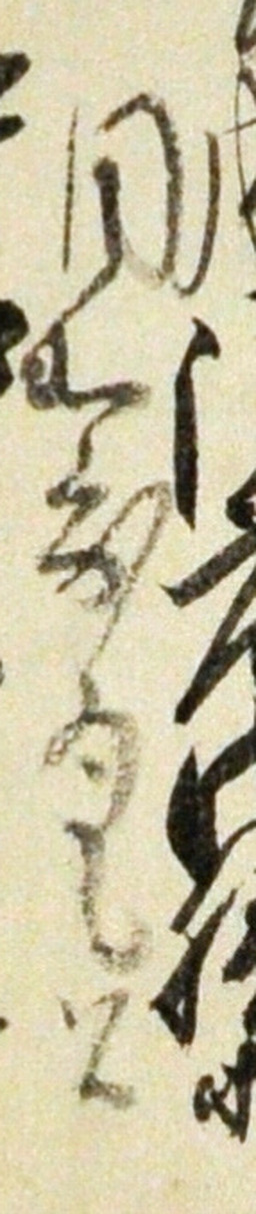目出度存候以上
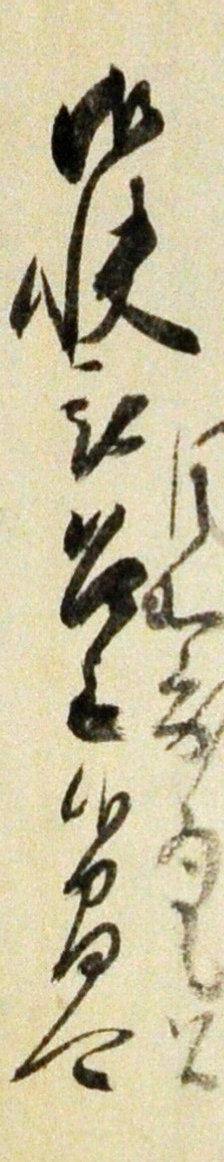御快被召上候間可
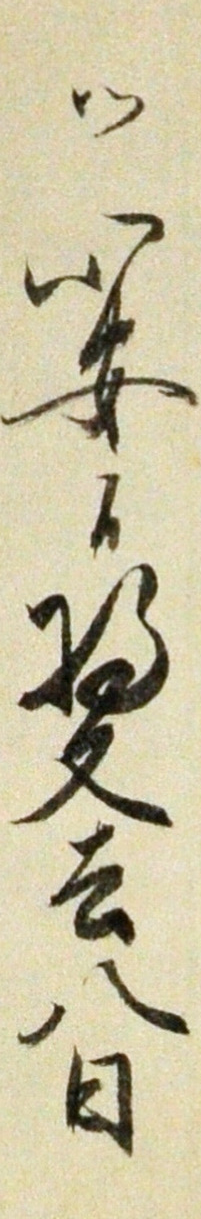御心安候将又去八日
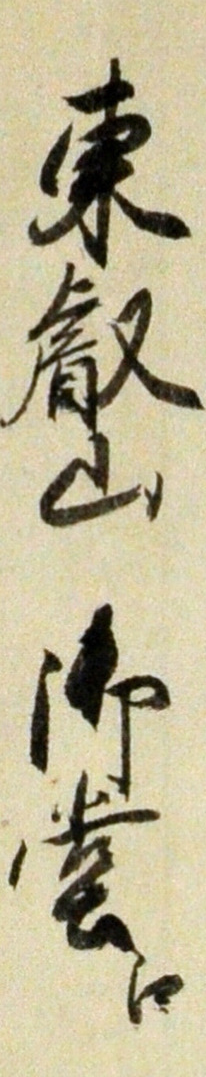東叡山御堂江
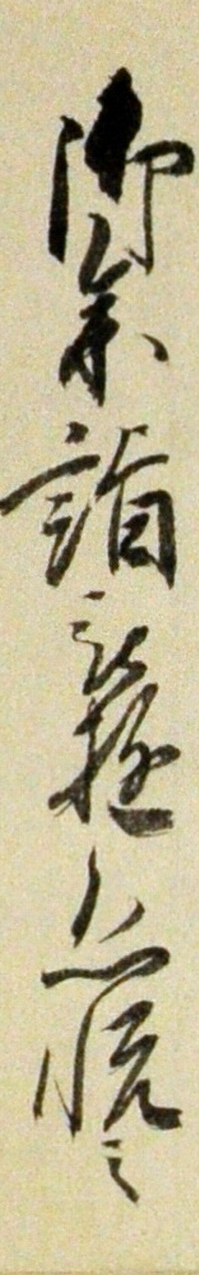御参詣被遊恐悦之
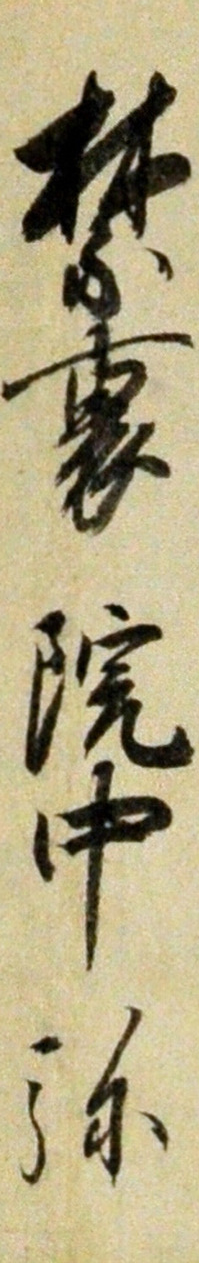禁裏院中弥
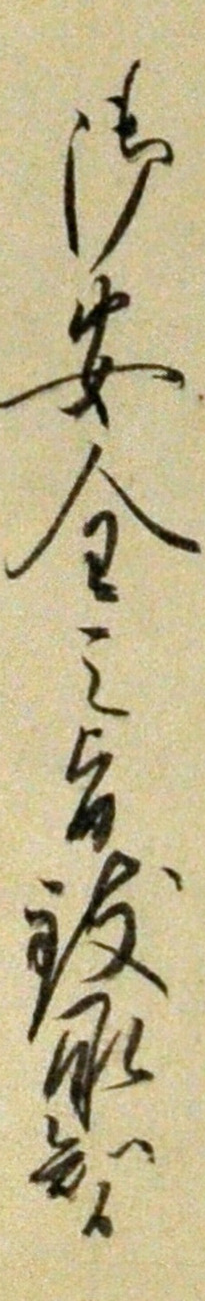御安全之旨致承知候
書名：書状
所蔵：伊那市立高遠町図書館・合同会社AMANE
